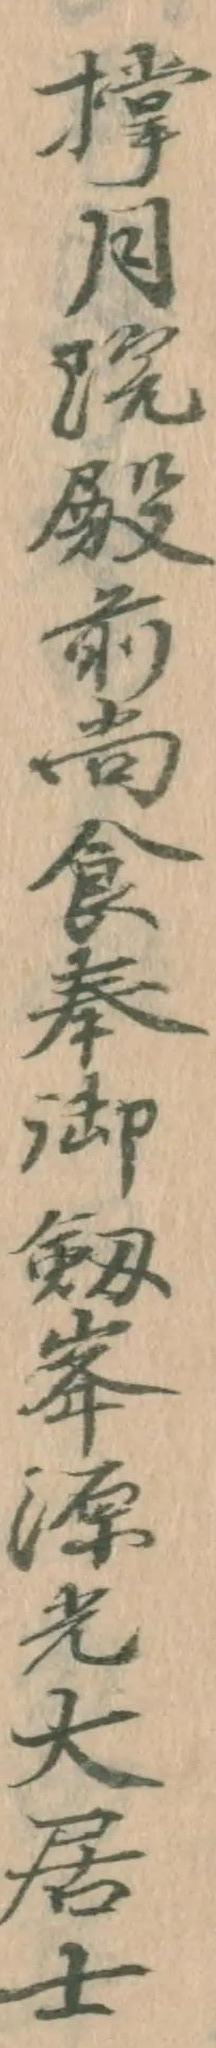撐月院殿前尚食奉御剱嶺源光大居士
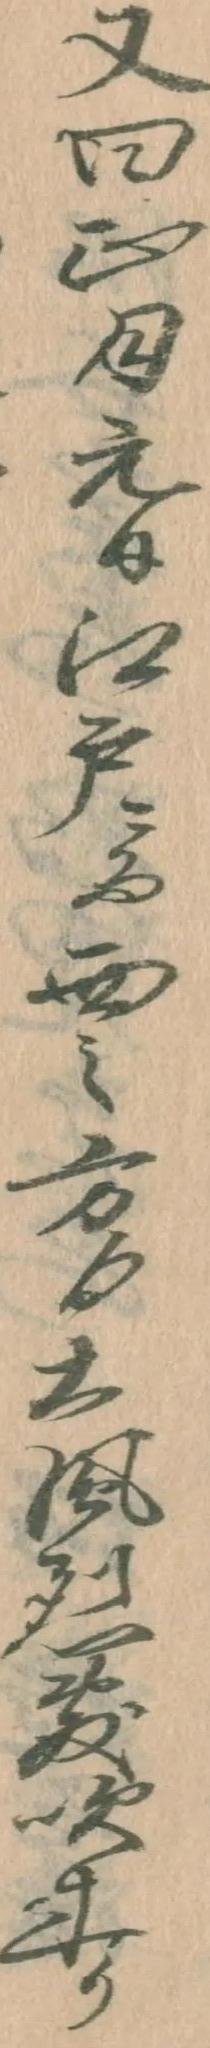又曰正月元日江戸に而西之方ゟ大風烈敷吹来り
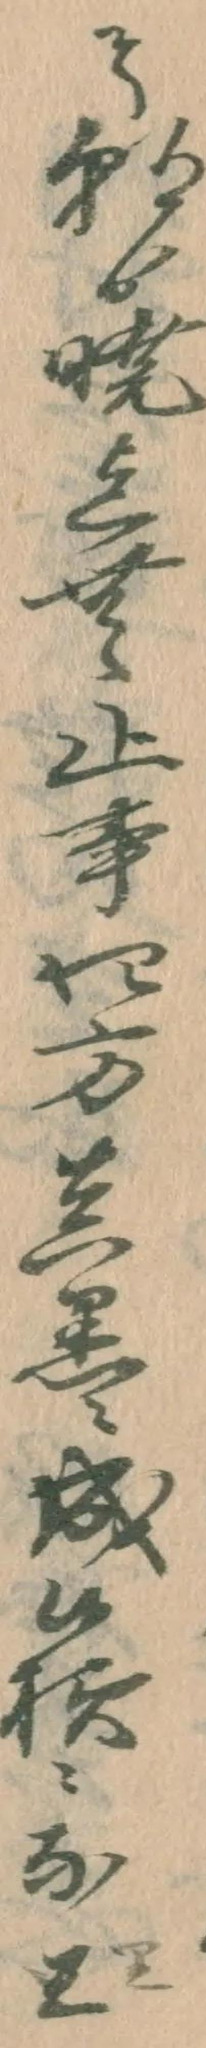て朝ゟ暁迄無止事四方真黒に成候様にな里
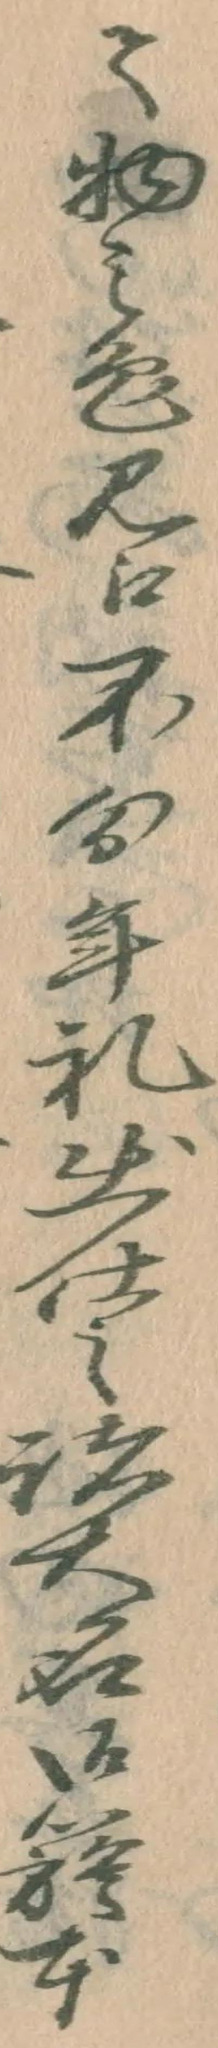て物之色見江不分年礼出仕之諸大名御籏本
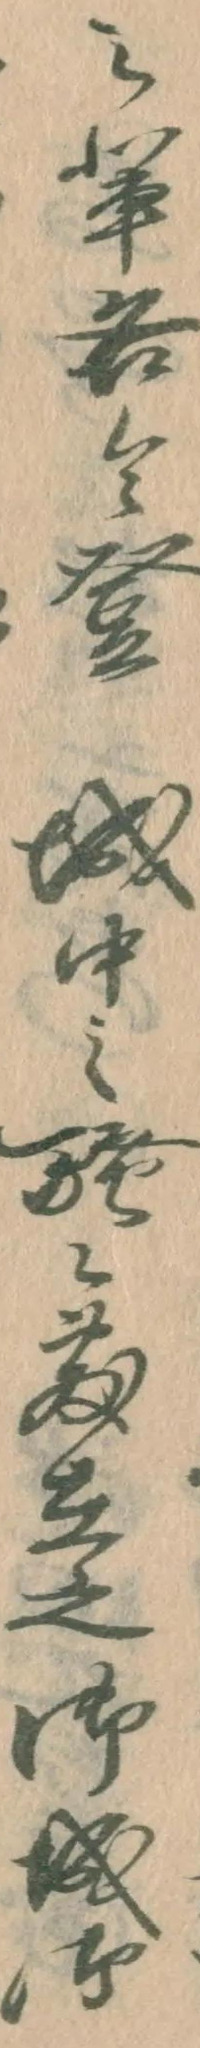之輩各令登城中之騒々敷在之御城御
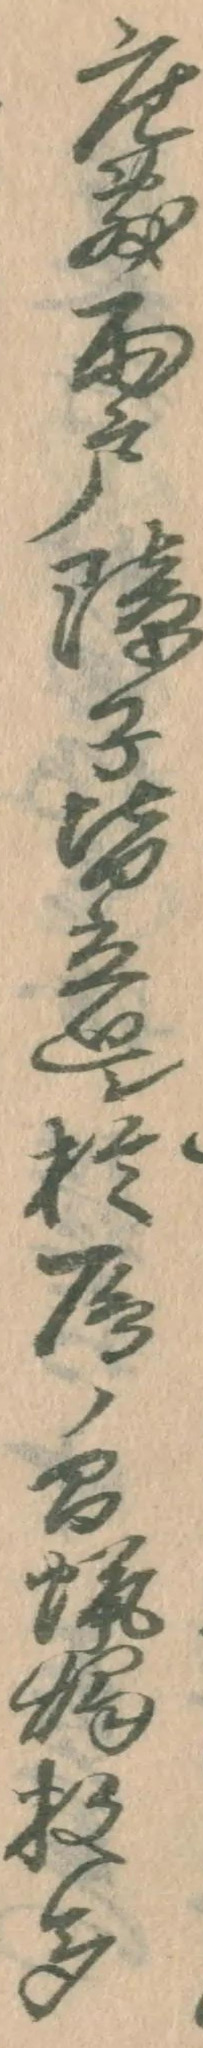座敷雨戸障子皆立廻し於為之間蝋燭数多
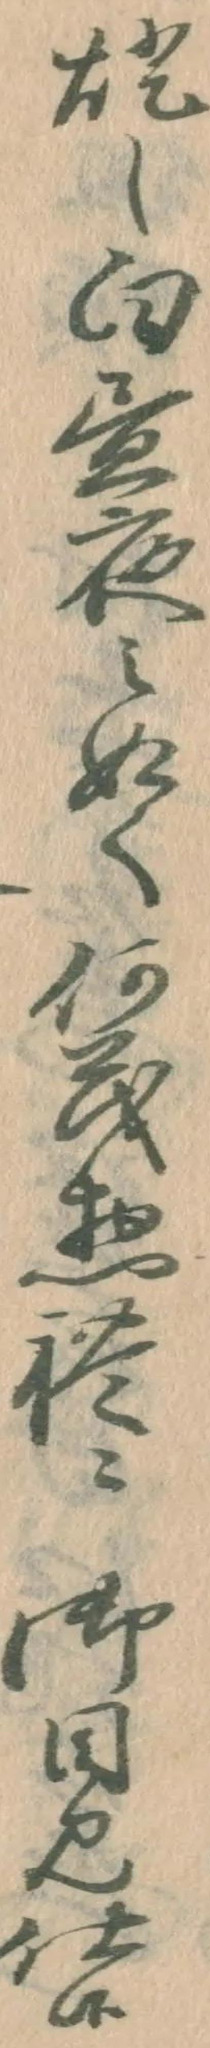燈し白昼夜之如く何茂惣禮に御目見仕候
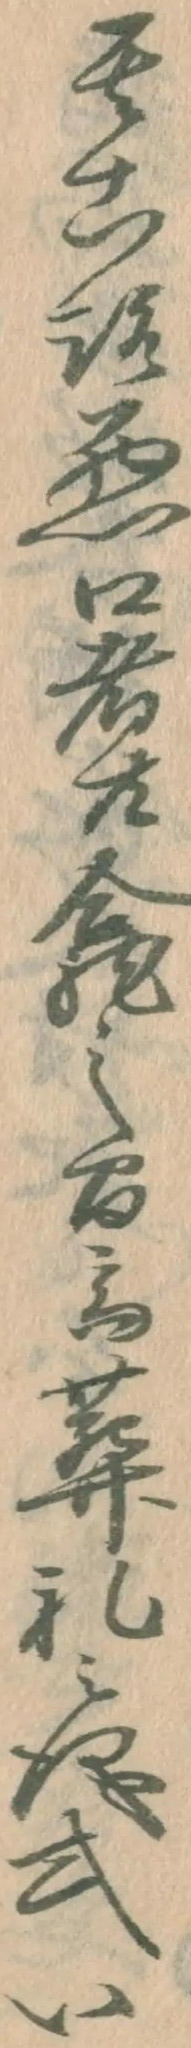其古路悪口者共龕之間に而葬礼之儀式い
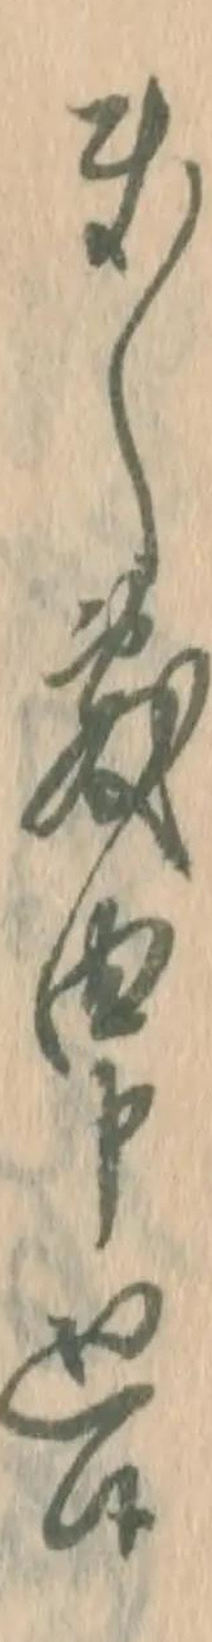ま〳〵敷由申廻候

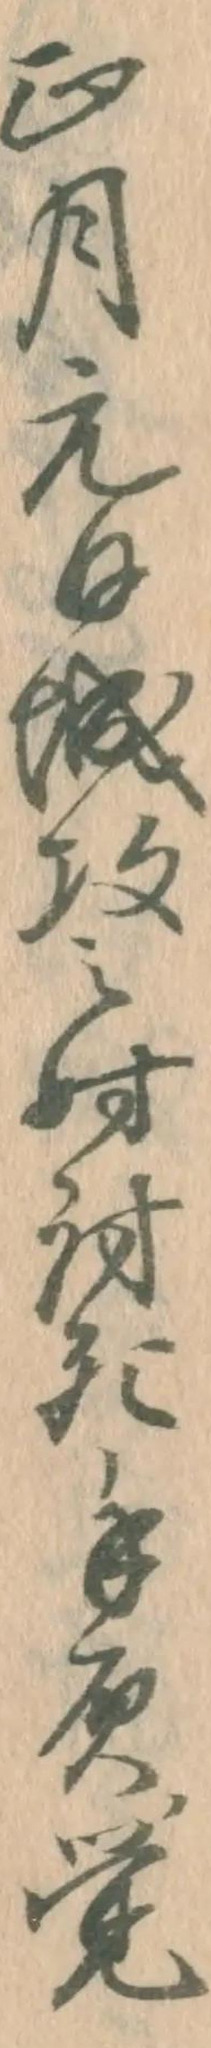正月元日城攻之時討死手負覚
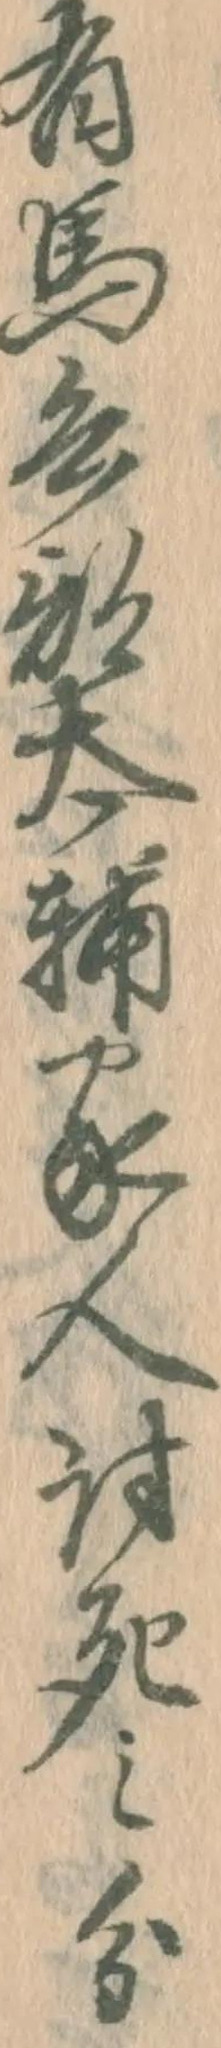有馬兵部太輔家人討死之分
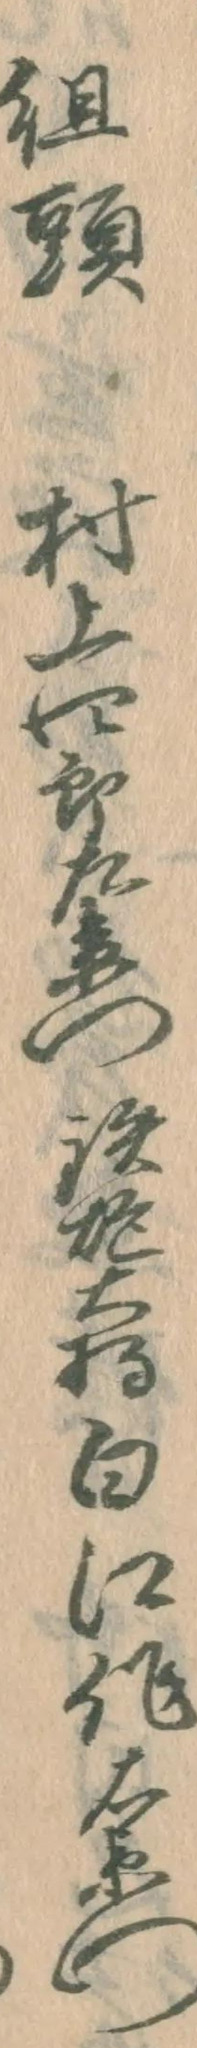組頭村上四郎左衛門鉄炮大将白江作右衛門
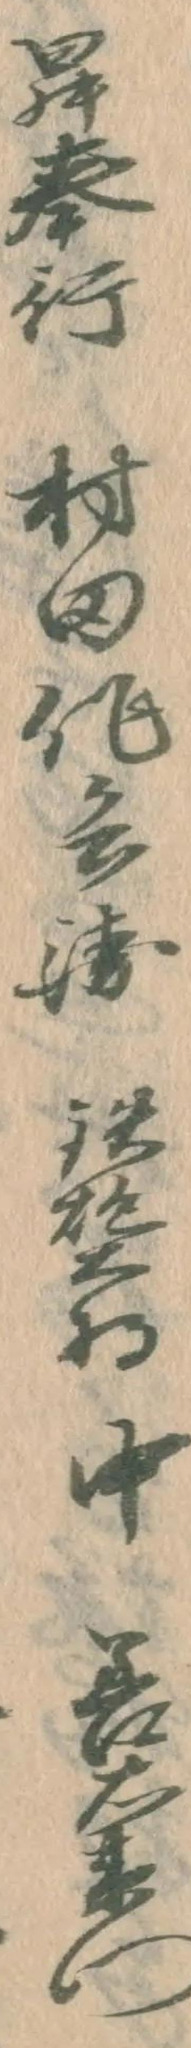昇奉行村田作兵衛鉄炮大将中善右衛門
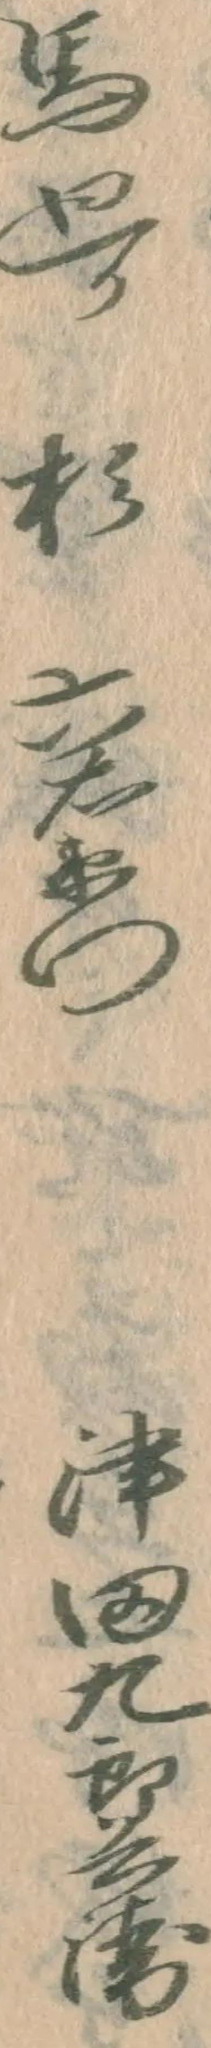馬廻り杉六右衛門津田九郎兵衛
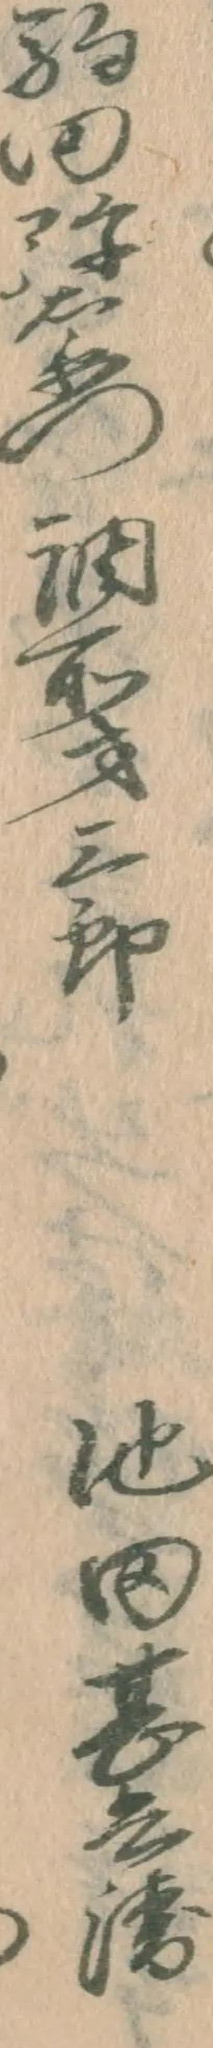駒田弥右衛門調取才三郎池田甚兵衛
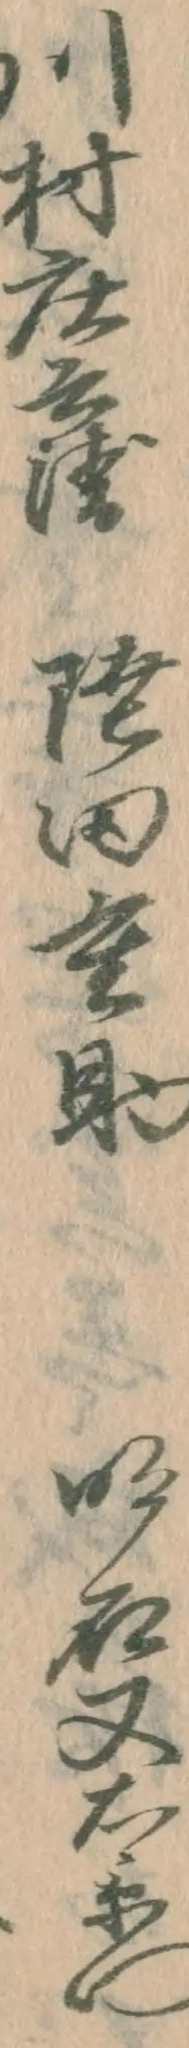川村庄兵衛陸田重助明石又右衛門
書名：切支丹御退治記 49巻. [5]
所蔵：国立国会図書館 National Diet Library, JAPAN
